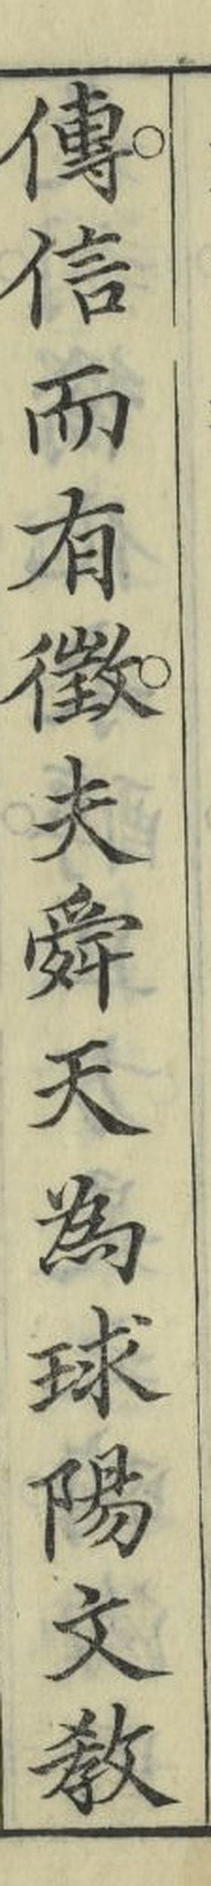傳。信而有徵。夫舜天為球陽文敎
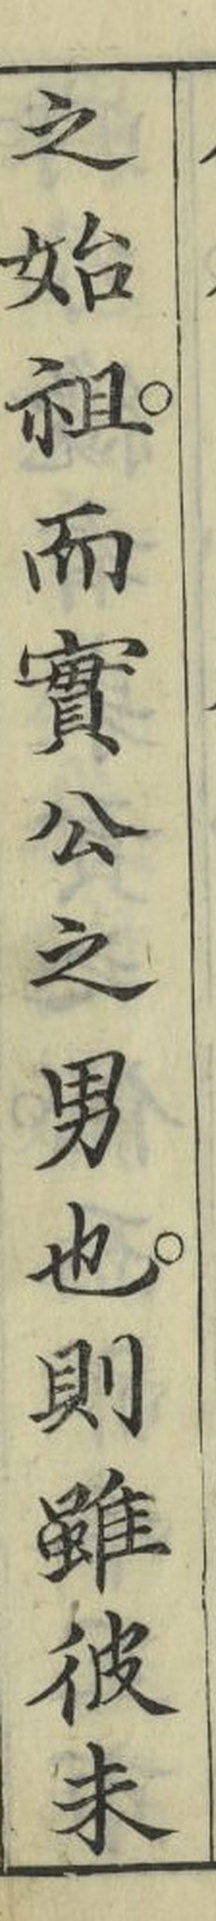之始祖。而實公之男也。則雖彼未
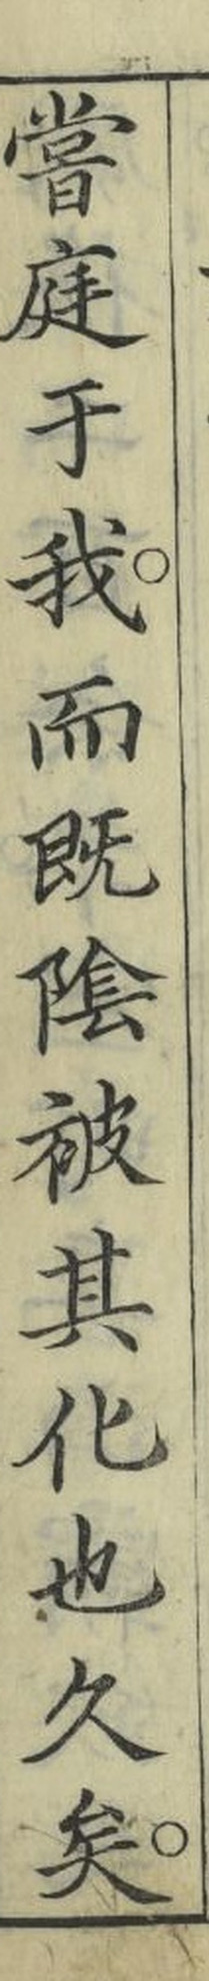嘗庭于我。而既隂被其化也久矣。

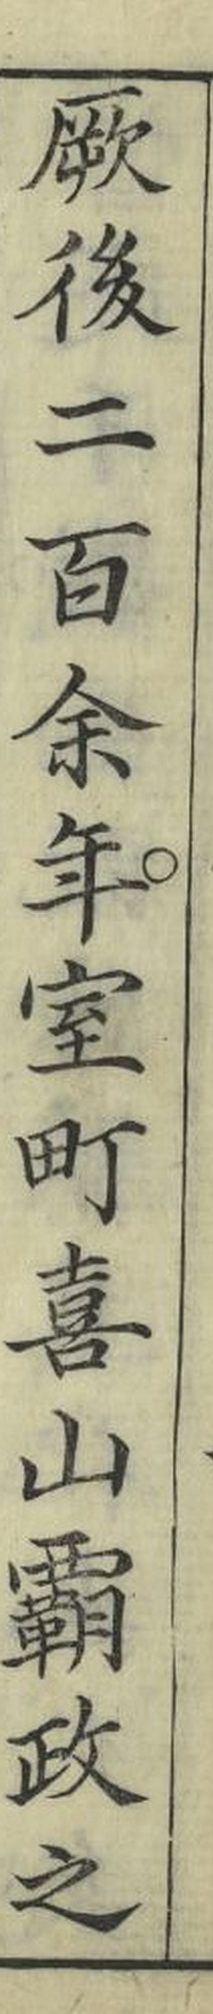厥後二百余年。室町喜山覇政之
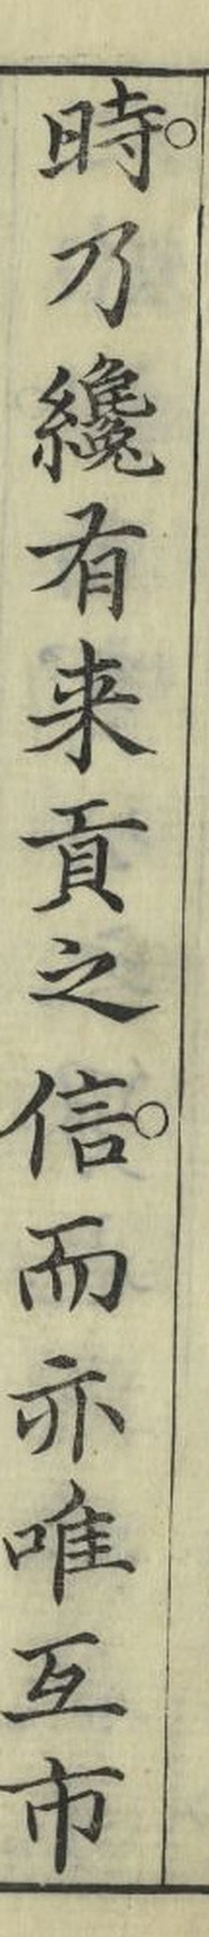時。乃纔有来貢之信。而亦唯互市
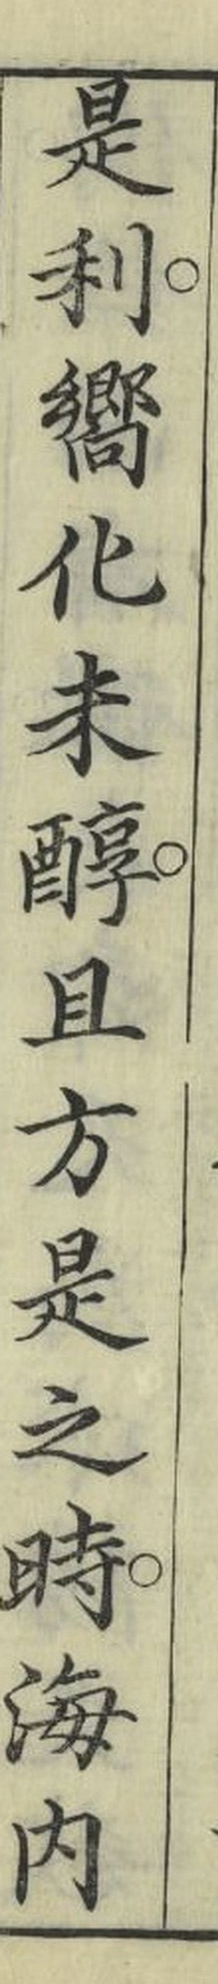是利。嚮化未醇。且方是之時。海内
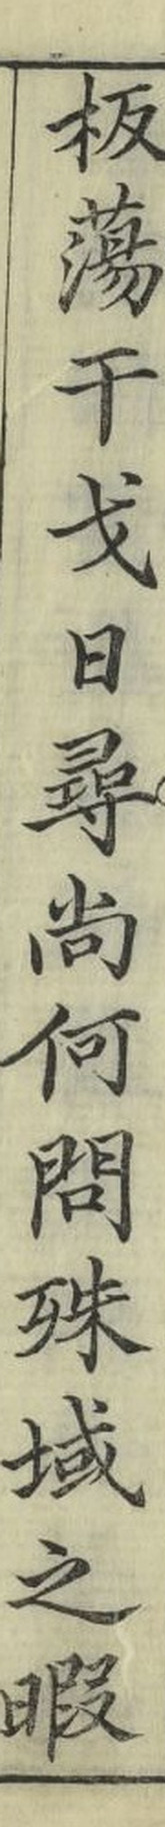板蕩。干戈日尋。尚何問殊域之暇
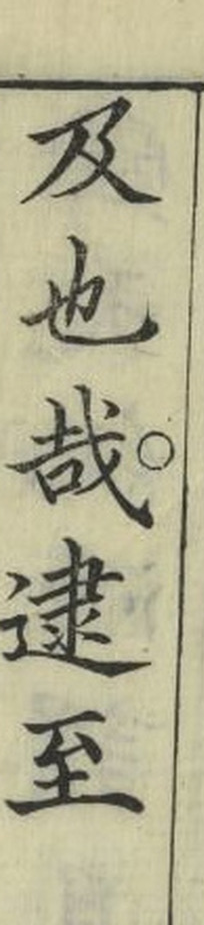及也哉。逮至
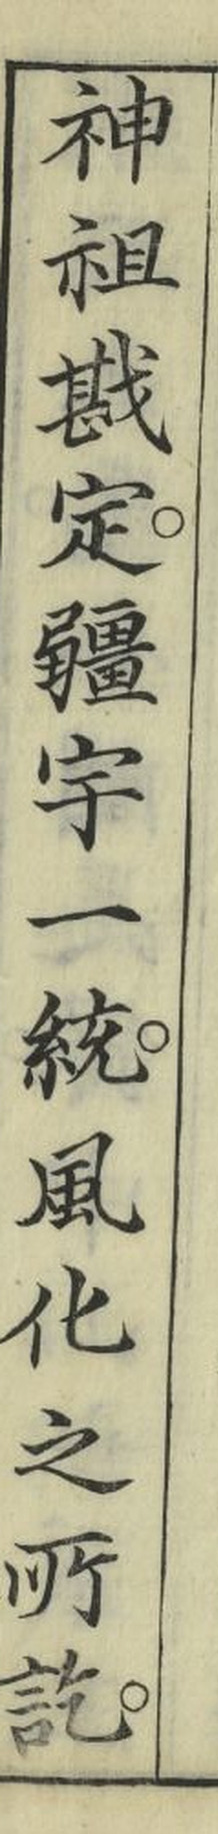神祖戡定。疆宇一統。風化之所訖。
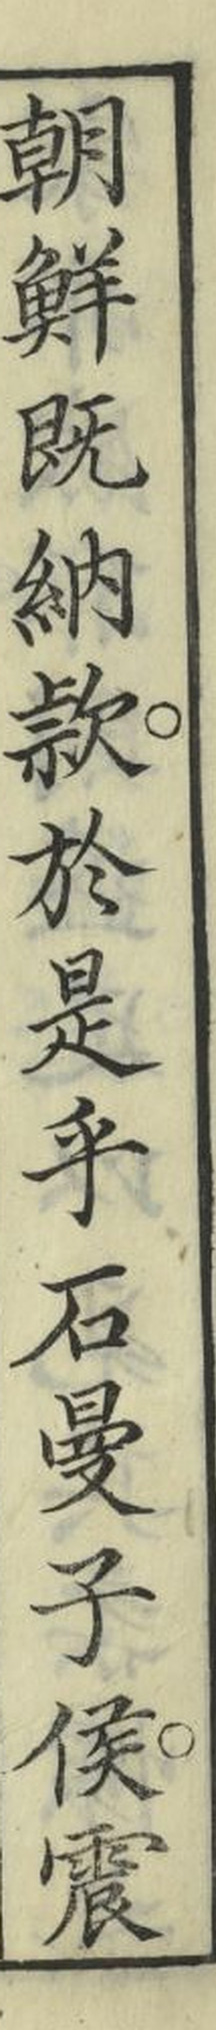朝鮮既納款。於是乎石曼子侯。震
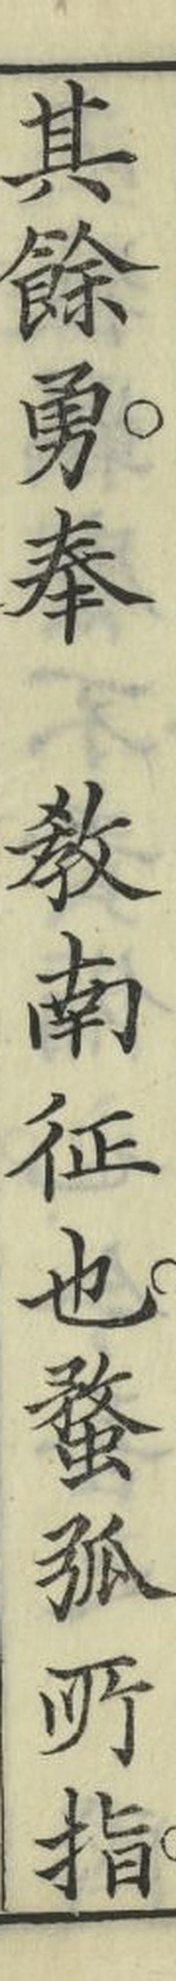其餘勇。奉敎南征也。蝥弧所指。
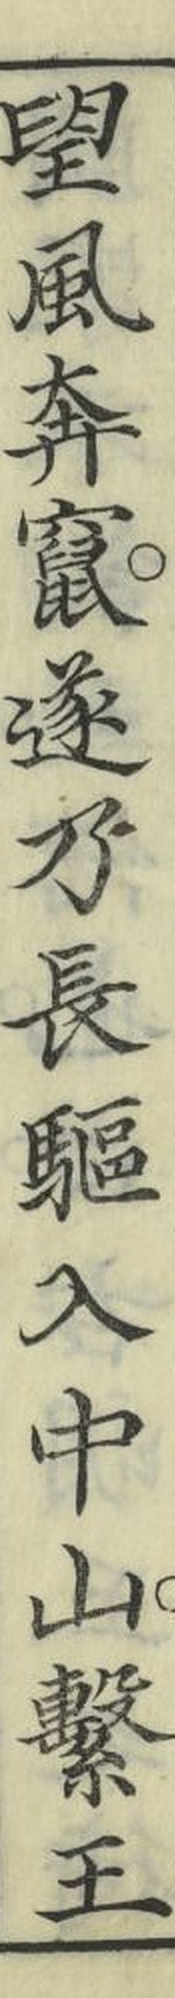望風奔竄。遂乃長驅入中山。繫王
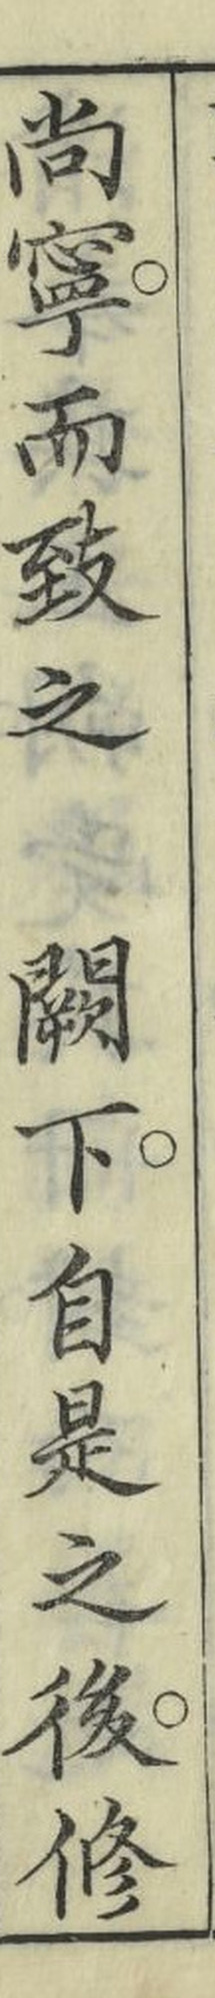尚寧。而致之闕下。自是之後。修
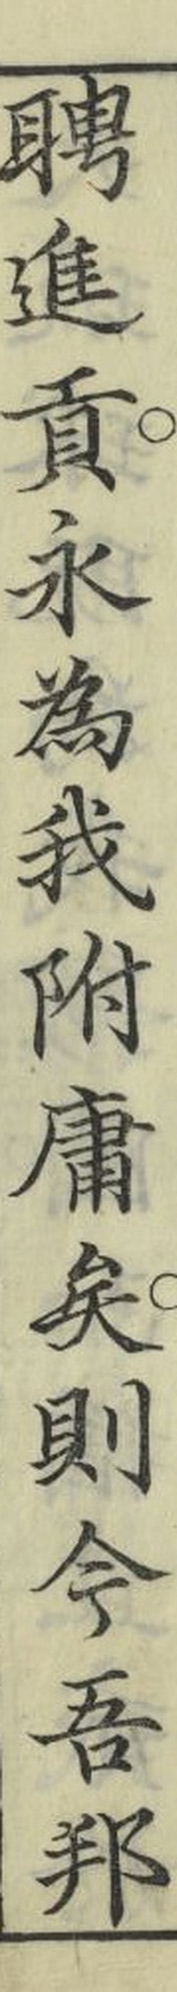聘進貢。永為我附庸矣。則今吾邦
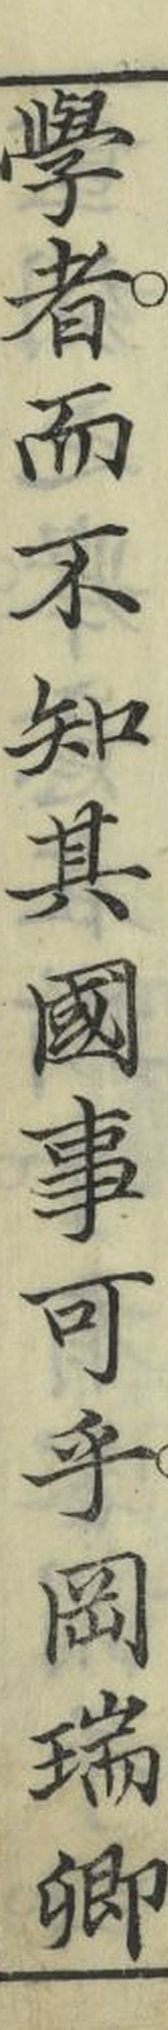學者。而不知其國事可乎。岡瑞卿

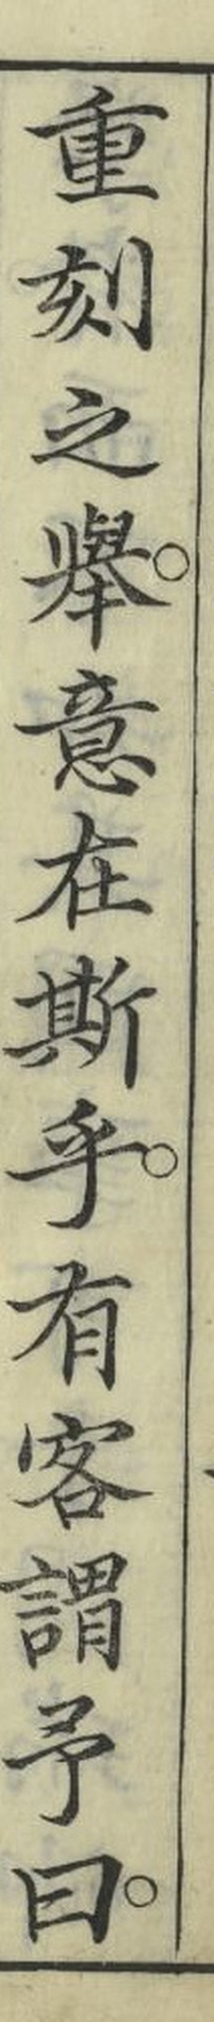重刻之舉。意在斯乎。有客謂予曰。
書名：中山伝信録 巻一
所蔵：University of the Ryukyus Library
